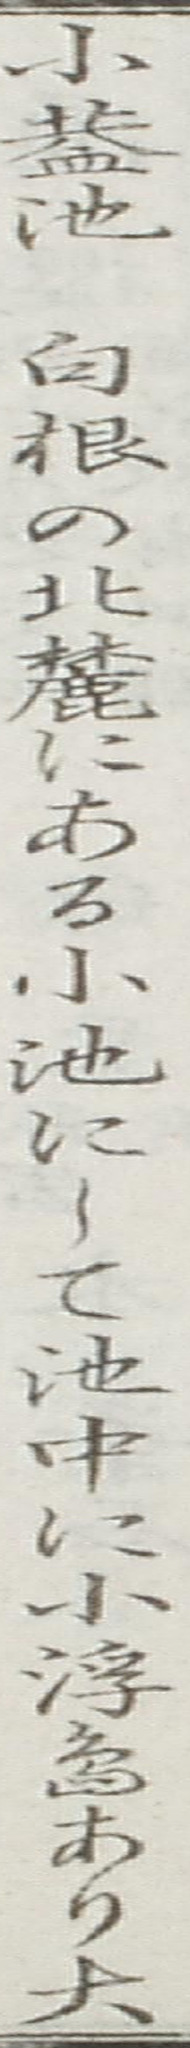小葢池白根の北麓にある小池にして池中に小浮島あり大
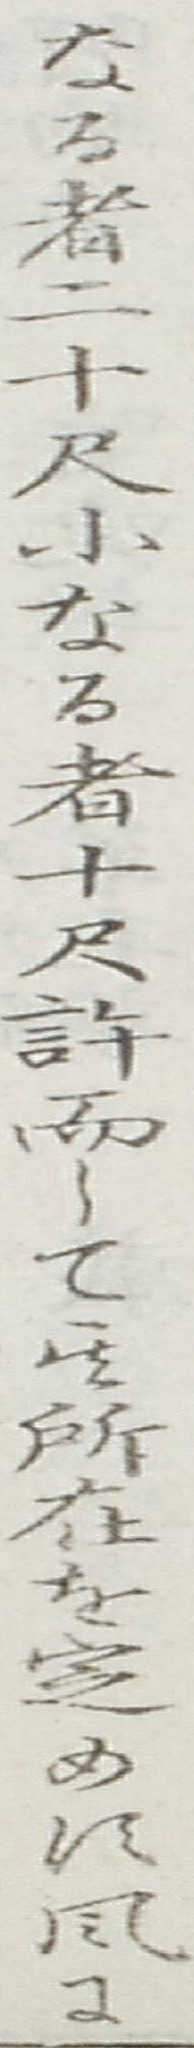なる者二十尺小なる者十尺許而して其所在を定めす風に浮
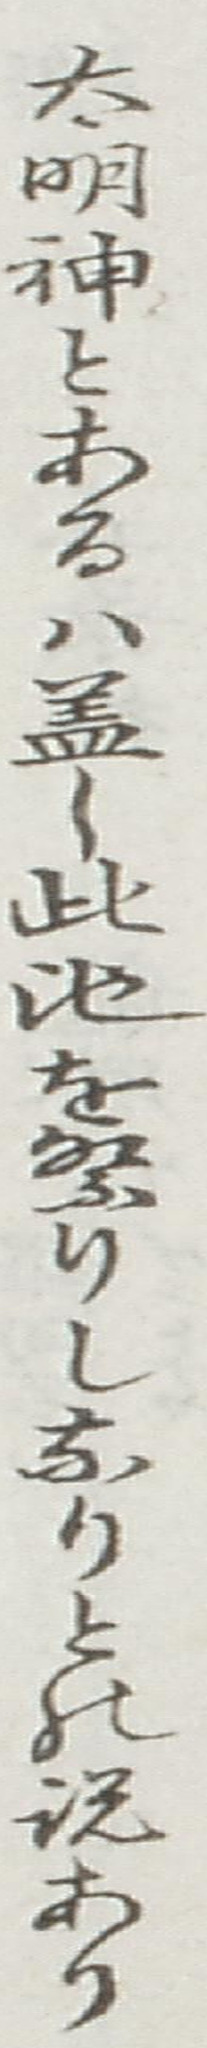大明神とあるは蓋しこの池を祭りしなりとの説あり
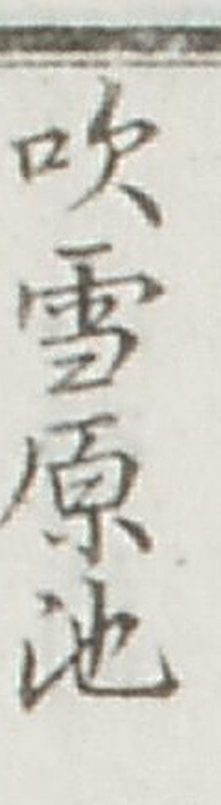吹雪原池
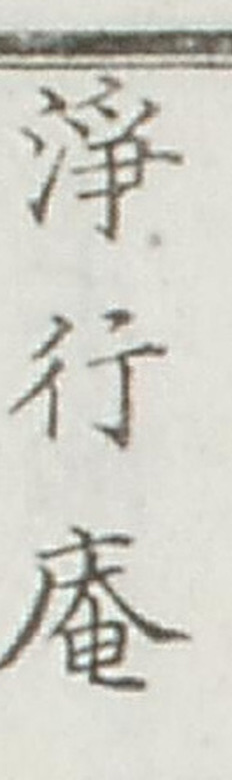浄行庵

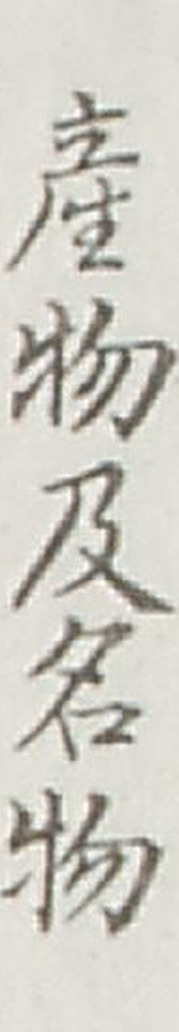産物及名物

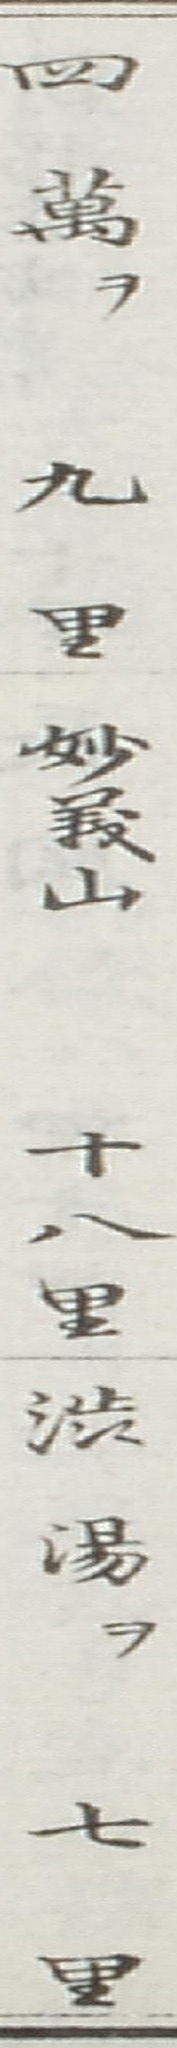四萬ヲ九里妙義山十八里渋湯ヲ七里

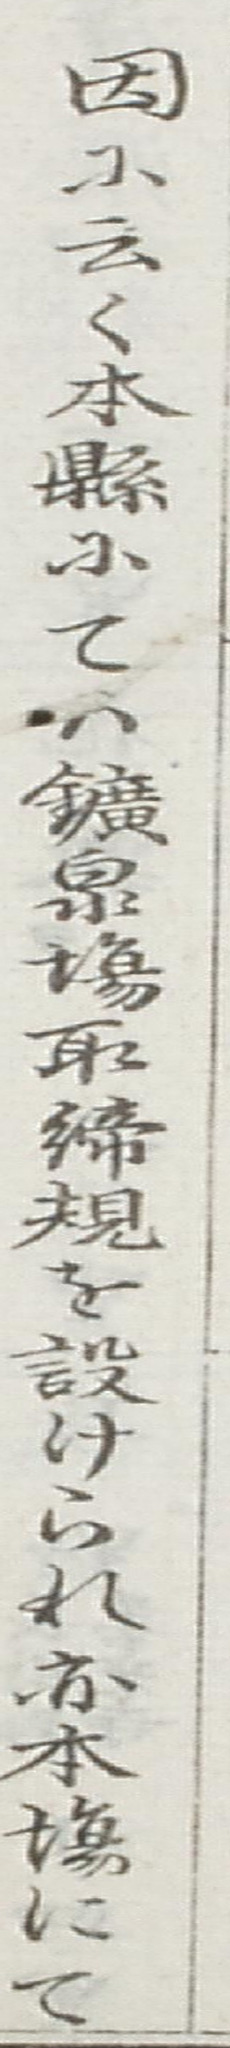因に云く本県にては鉱泉場取締規を設けられ亦本場にて
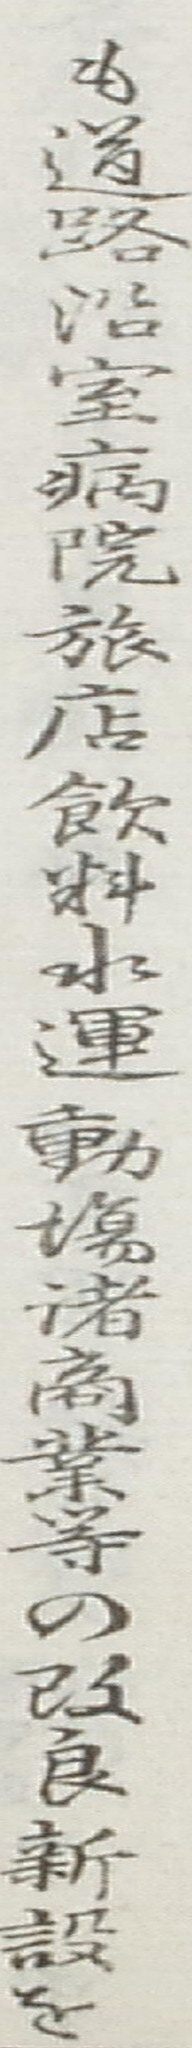も道路浴室病院旅店飲料水運運動場諸商業等の改良新設を
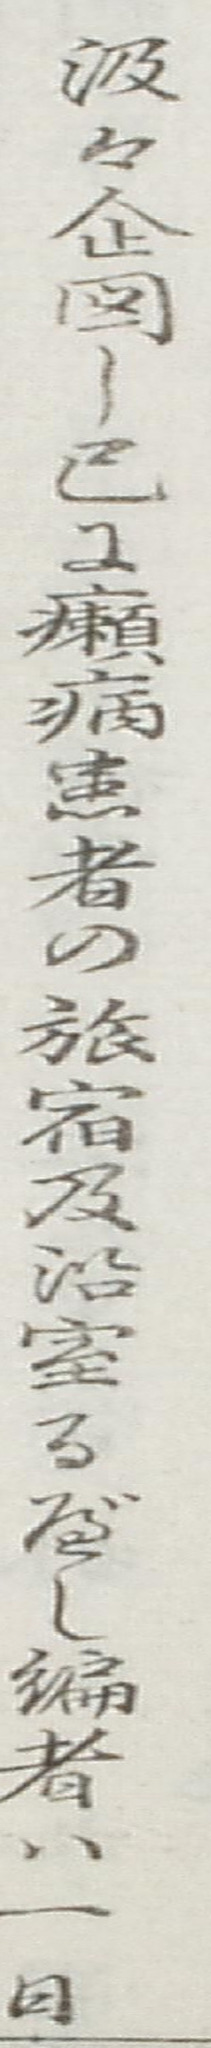汲々企図し己に癩病患者の旅宿及び浴室るべし編者は一日
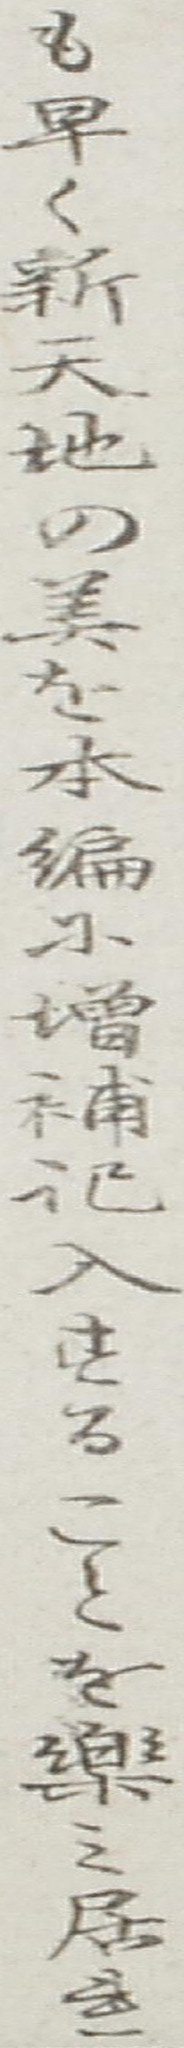も早く新天地の美を本編に増補記入することを楽み居れ
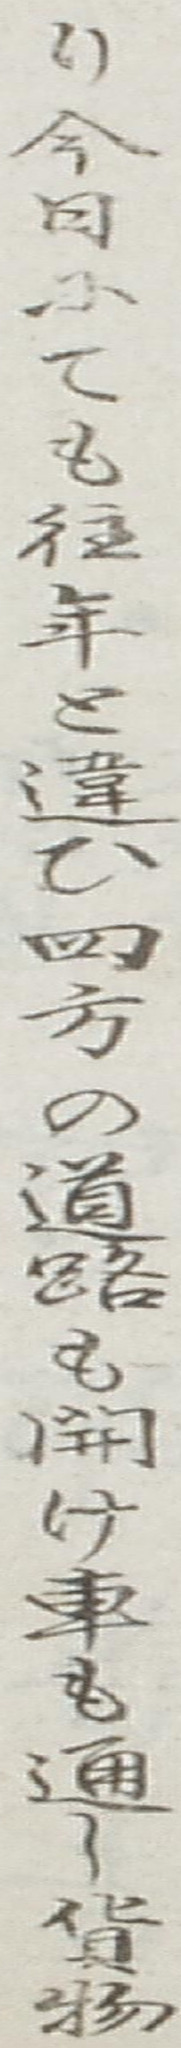り今日にても往年と違ひ四方の道路も開け車も通し貨物
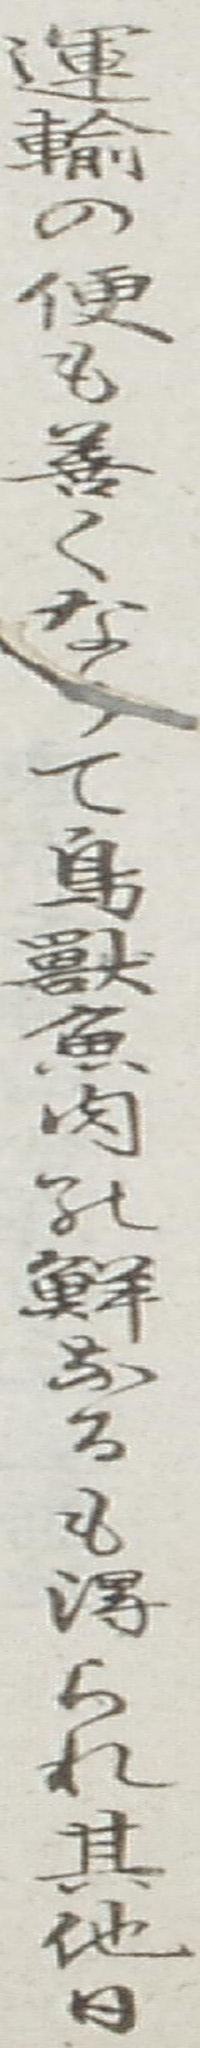運輸の便も善くなって鳥獣魚肉の鮮なるも得られ其他日
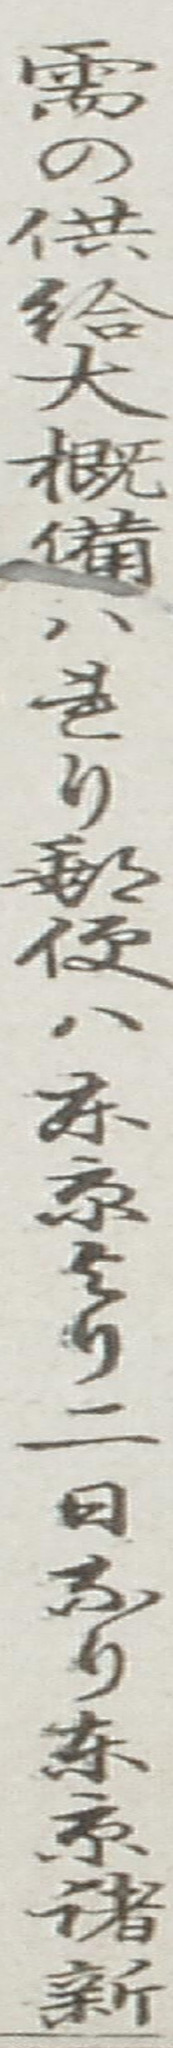需の供給大概備はれり数便は東京より二日なり東京諸新
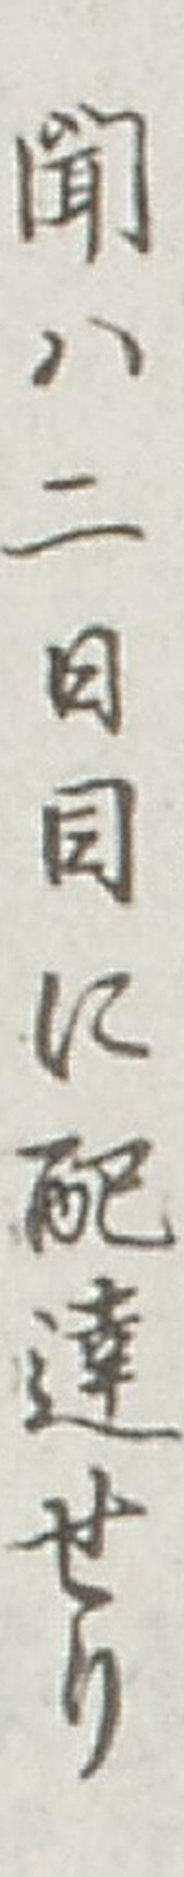聞は二日目に配達せり
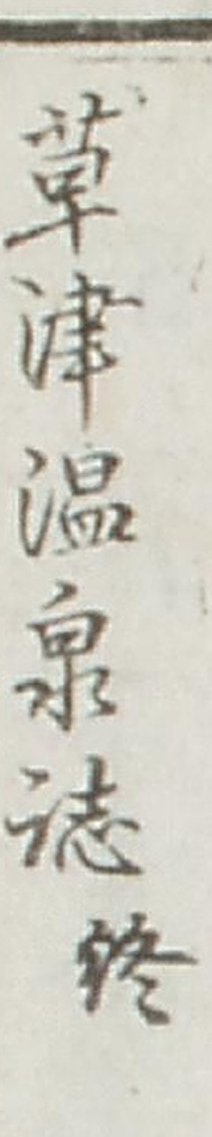草津温泉誌終
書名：草津温泉誌　全
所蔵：東京大学地震研究所図書室 Earthquake Research Institute Library, The University of Tokyo, JAPAN
